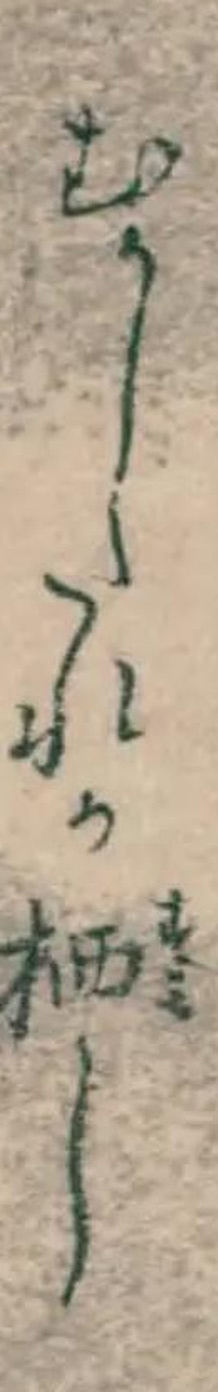むかしたれか栖し
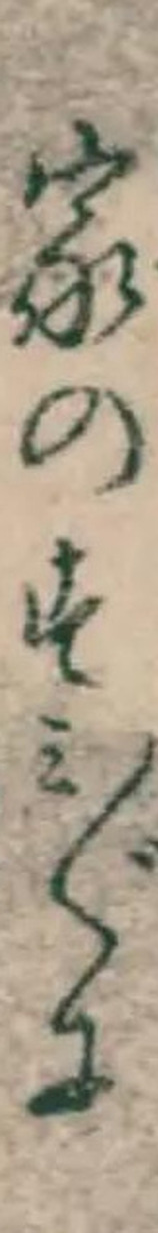家のすみ〴〵に
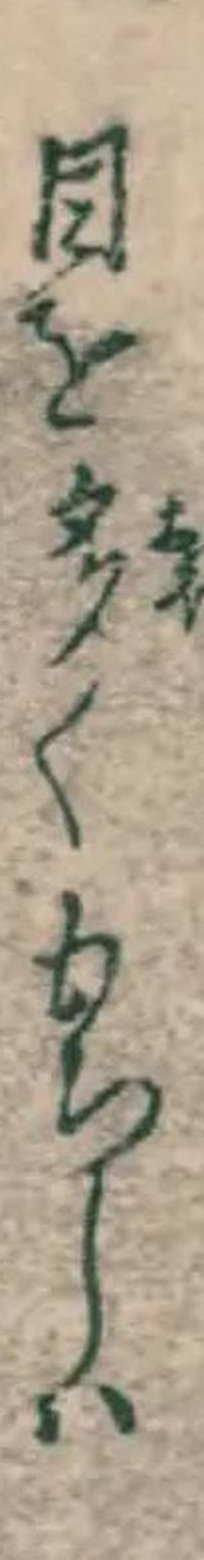目を多くもちしは
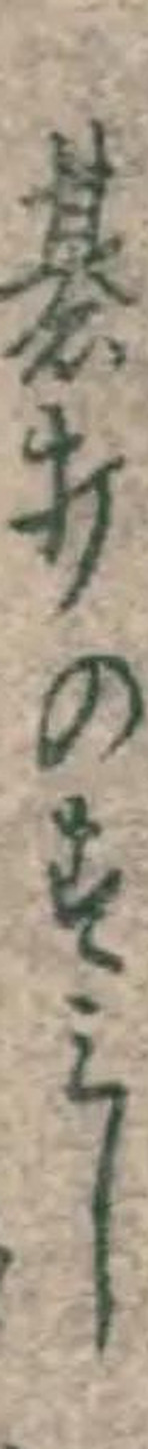碁打のすみし
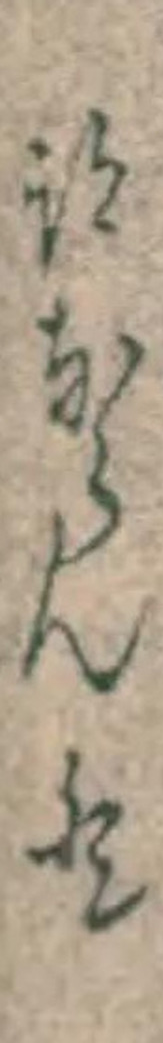跡ならんか
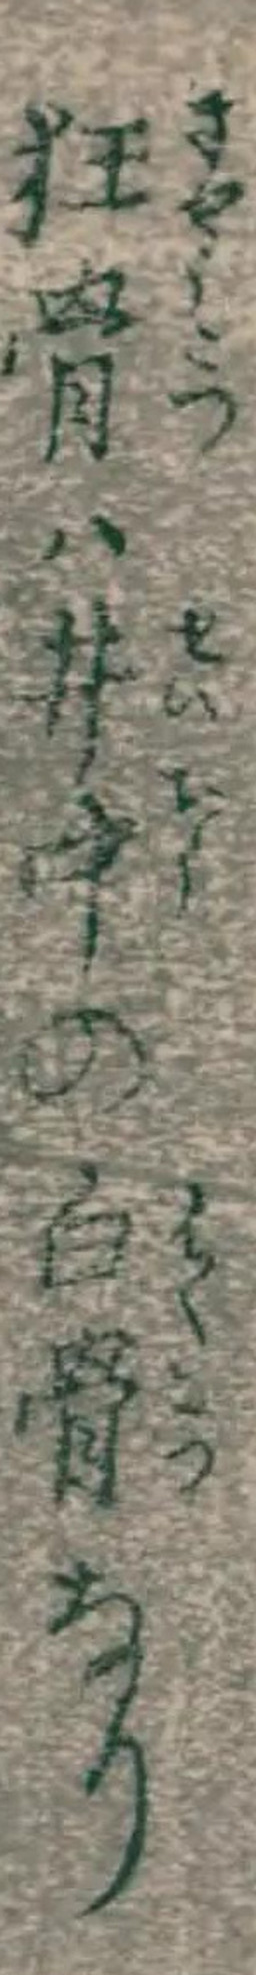狂骨は井中の白骨なり
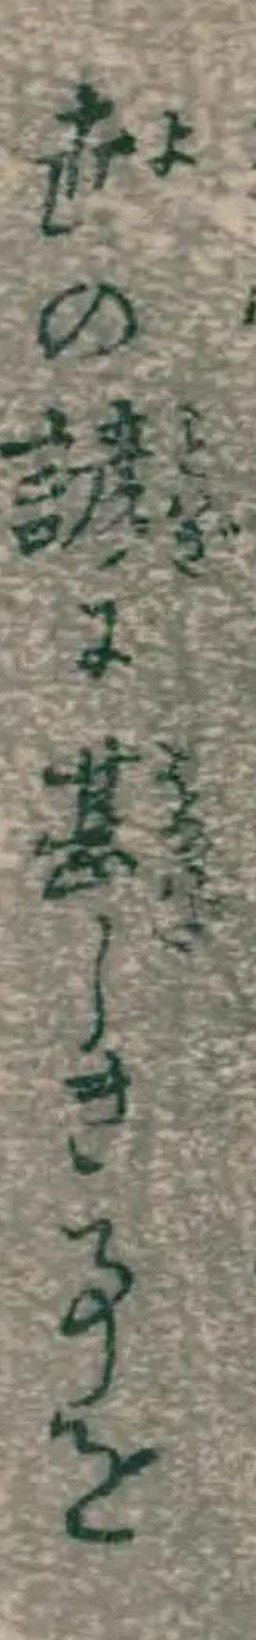世の諺に甚しき事を
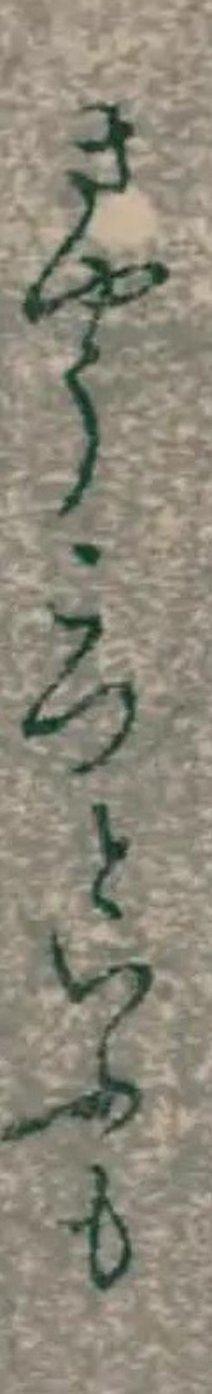きやうこつといふも
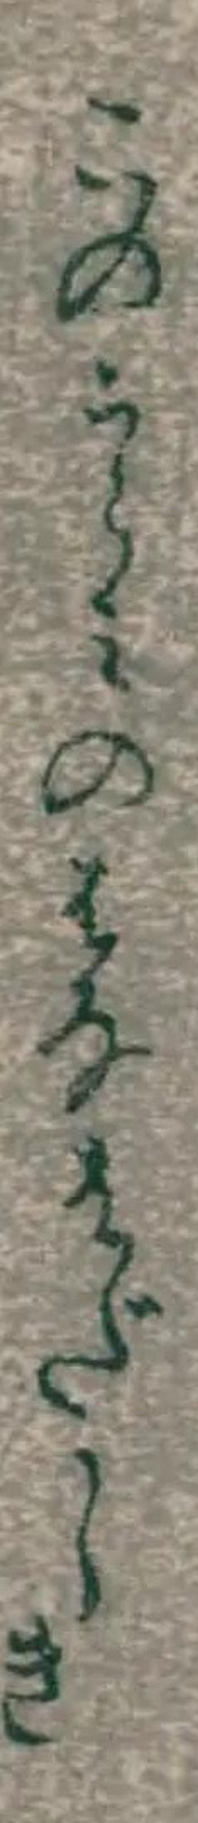このうらみのはなはだしき
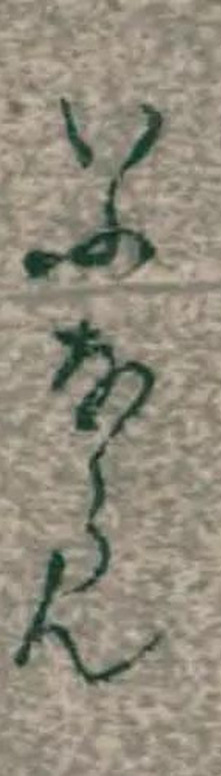いふならん

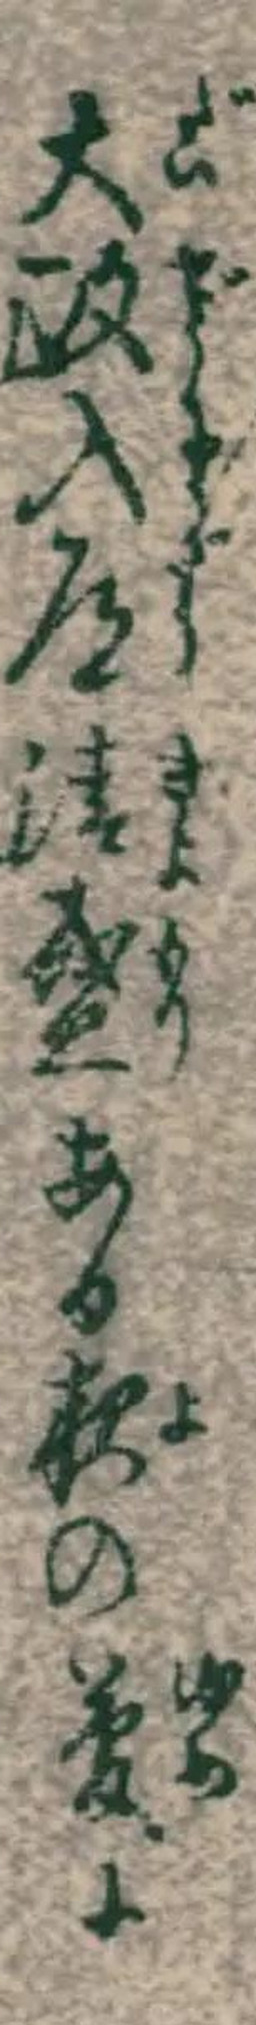大政入道清盛ある夜の夢に
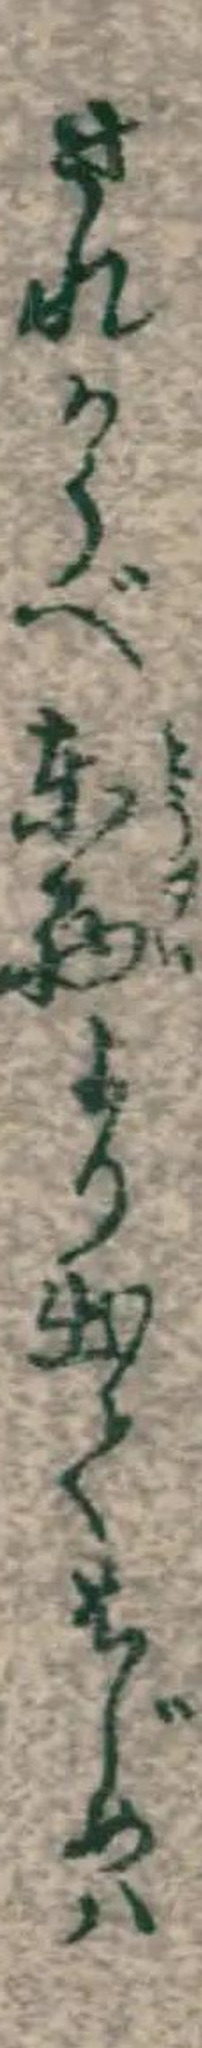されかうべ東西より出てはじめは
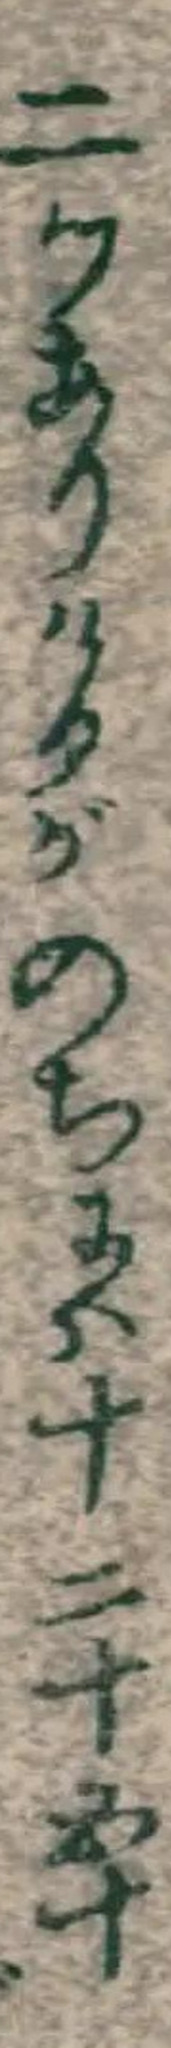二つありけるがのちには十二十五十
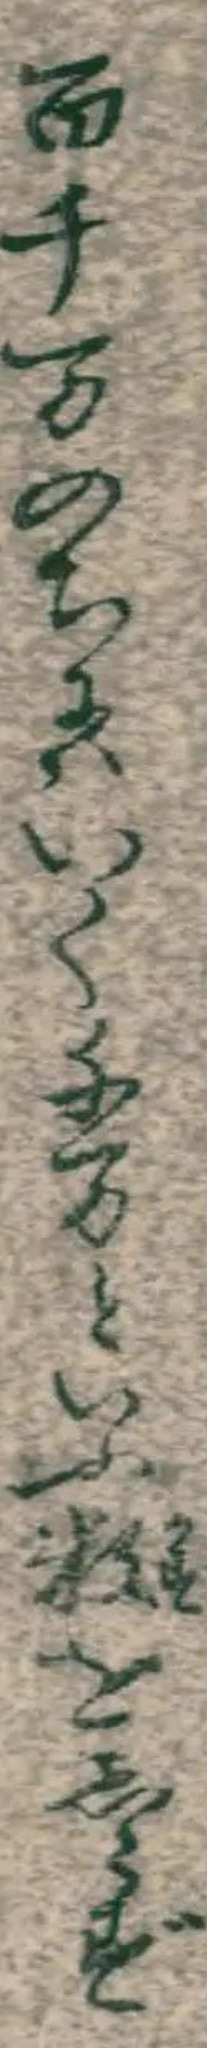百千万のちにはいく千万といふ数をしらず
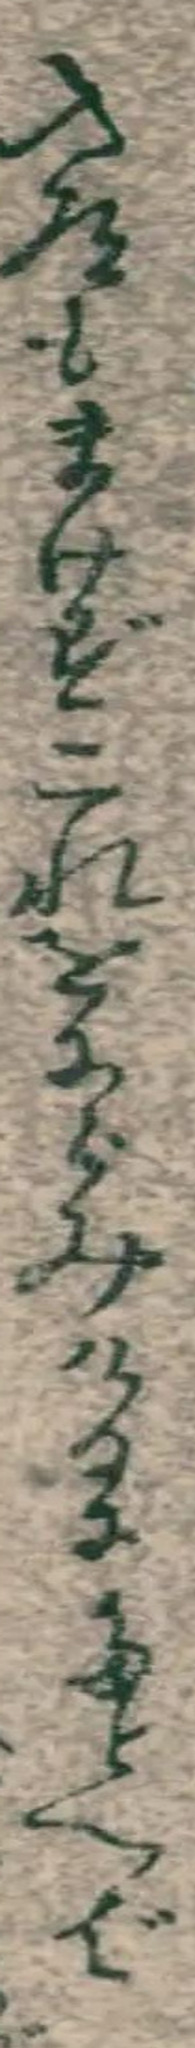入道もまけずこれをにらみけるにたとへば
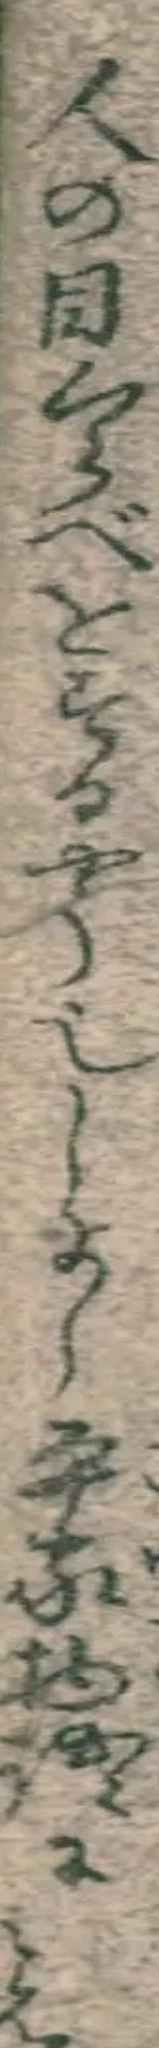人の目くらべをするやう也しよし平家物語にみえたり
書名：百鬼夜行 3巻拾遺3巻. [2]
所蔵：国立国会図書館 National Diet Library, JAPAN
